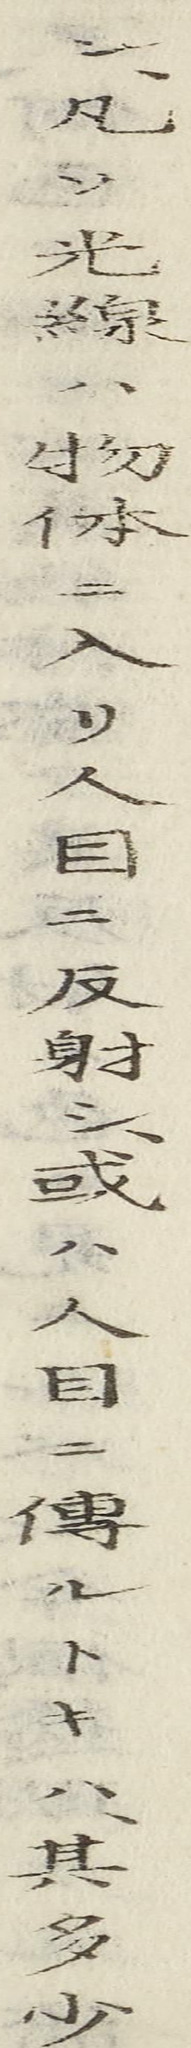シ、凡ソ光線ハ物体ニ入リ人目ニ反射シ、或ハ人目ニ伝ルトキハ、其多少
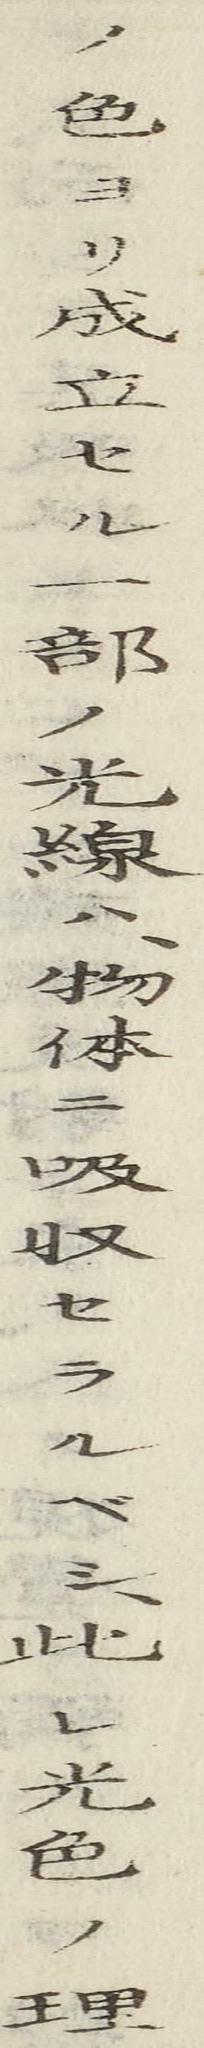ノ色ヨリ成立セル一部ノ光線ハ、物体ニ吸収セラルベシ、此レ光色ノ理

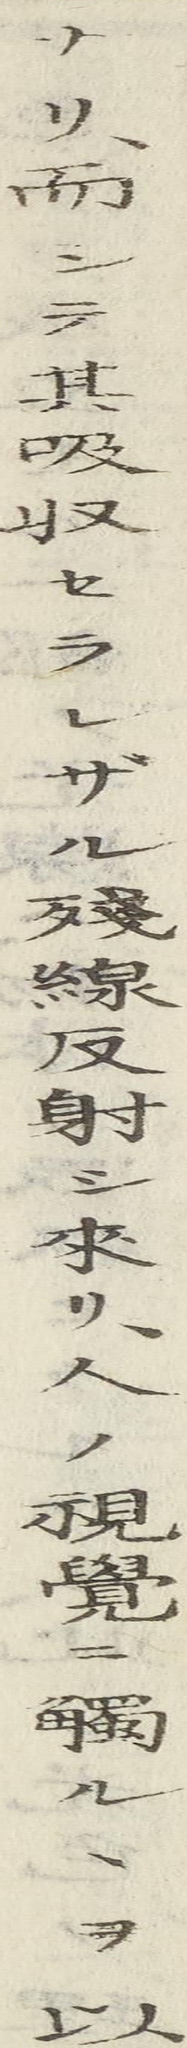ナリ、而シテ其吸収セラレザル残線反射シ来リ、人ノ視覚ニ触ルヽヲ以
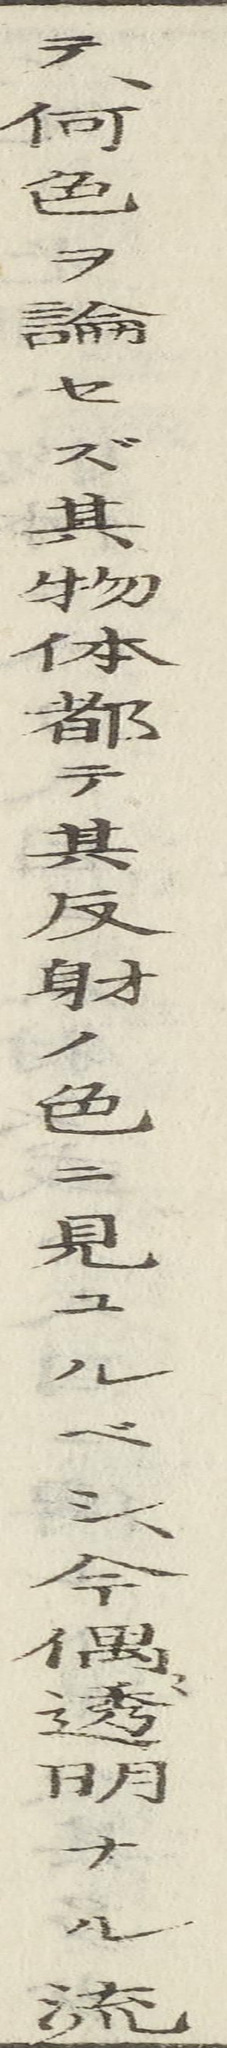テ、何色ヲ論セズ其物体都テ其反射ノ色ニ見ユルベシ、今偶〻透明ナル流
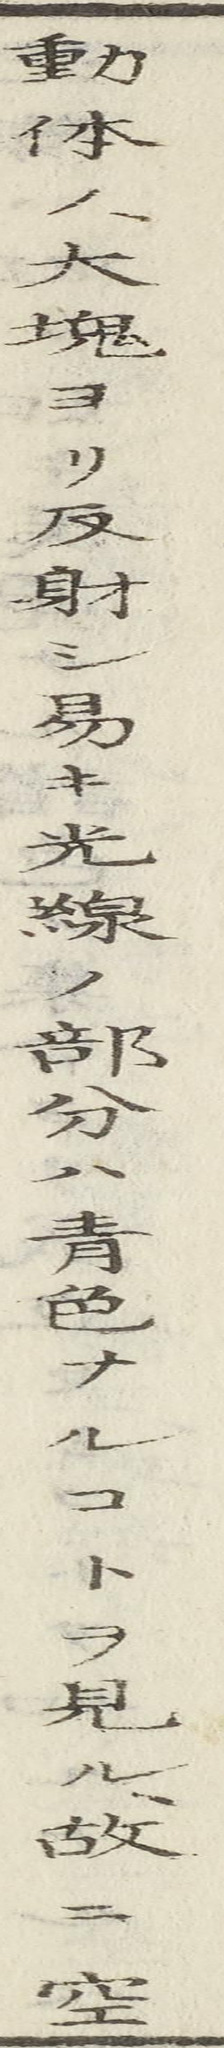動体ノ、大塊ヨリ反射シ易キ光線ノ部分ハ青色ナルコトヲ見ル、故ニ空
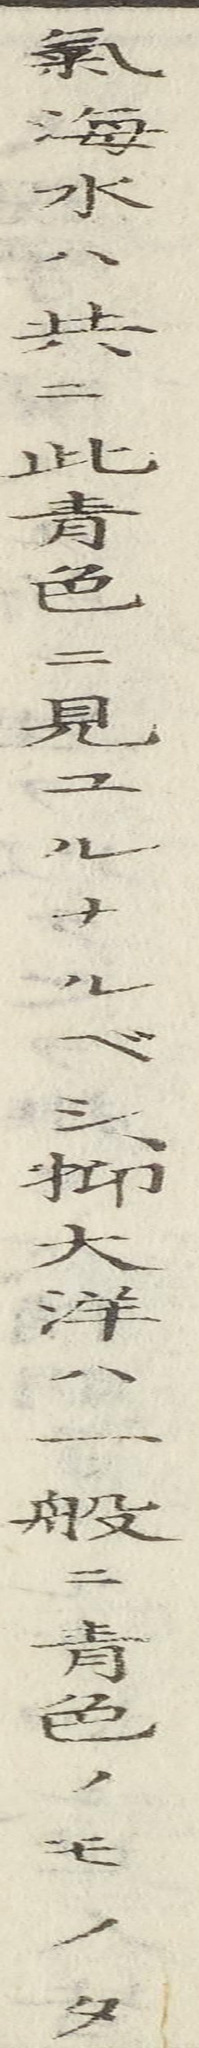気海水ハ共ニ此青色ニ見ユルナルベシ、抑大洋ハ一般ニ青色ノモノタ
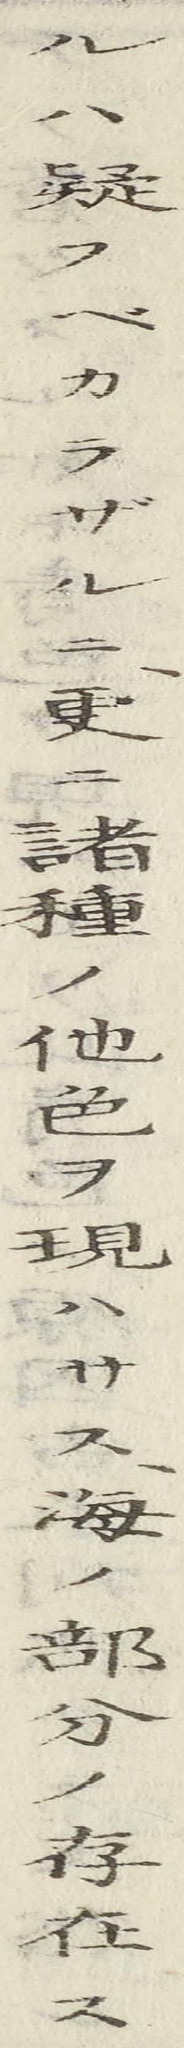ルハ疑フベカラザルニ、更ニ諸種ノ他色ヲ現ハサス、海ノ部分ノ存在ス
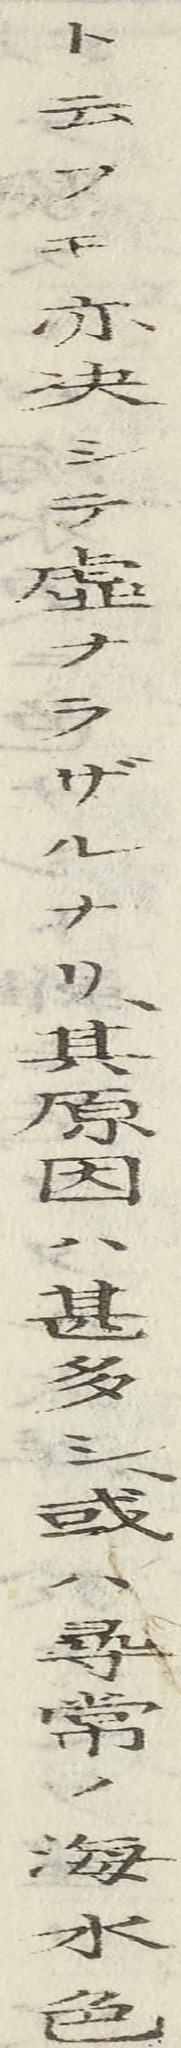ト云フモ亦決シテ虚ナラザルナリ、其原因ハ甚多シ、或ハ尋常ノ海水色
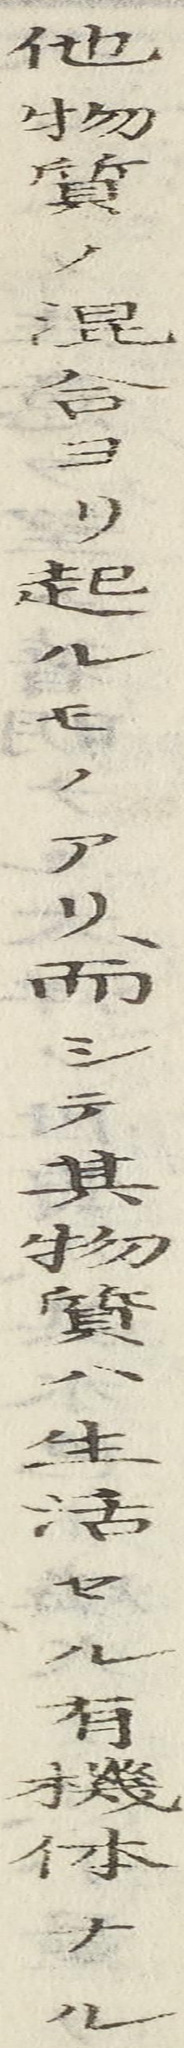他物質ノ混合ヨリ起ルモノアリ、而シテ其物質ハ生活セル有機体ナル
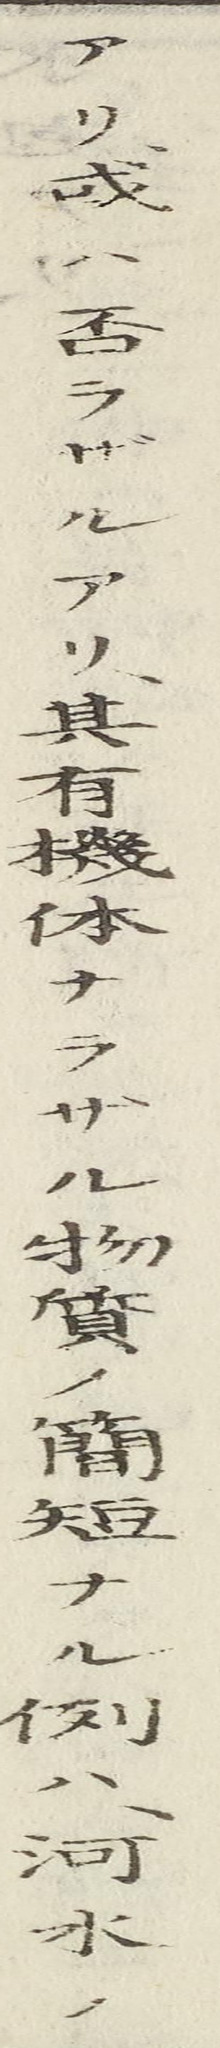アリ、或ハ否ラザルアリ、其有機体ナラザル物質ノ簡短ナル例ハ、河水ノ
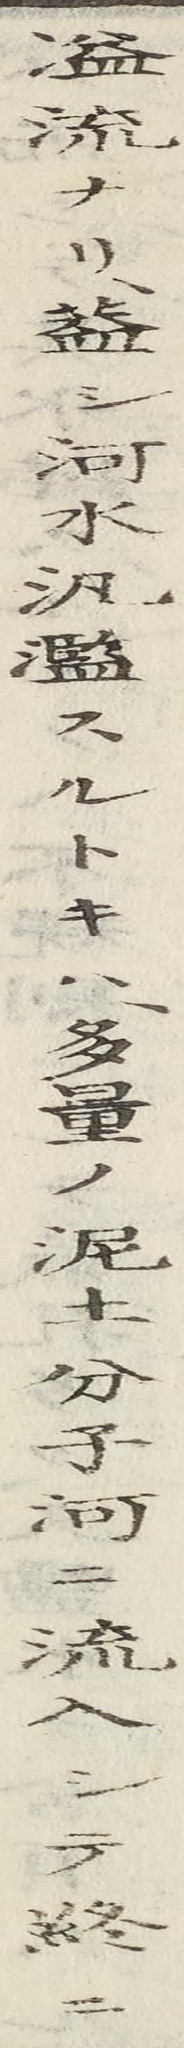溢流ナリ、蓋シ河水汎濫スルトキハ、多量ノ泥土分子河ニ流入シテ終ニ
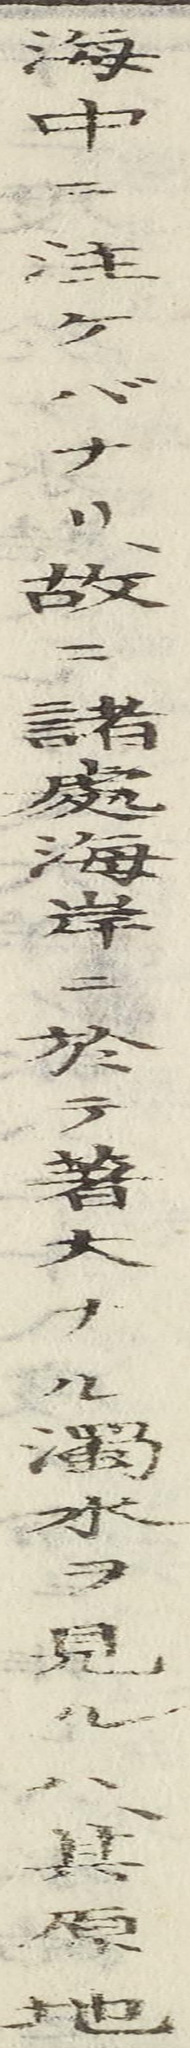海中ニ注ケバナリ、故ニ諸処海岸ニ於テ著大ナル濁水ヲ見ルハ、其原地
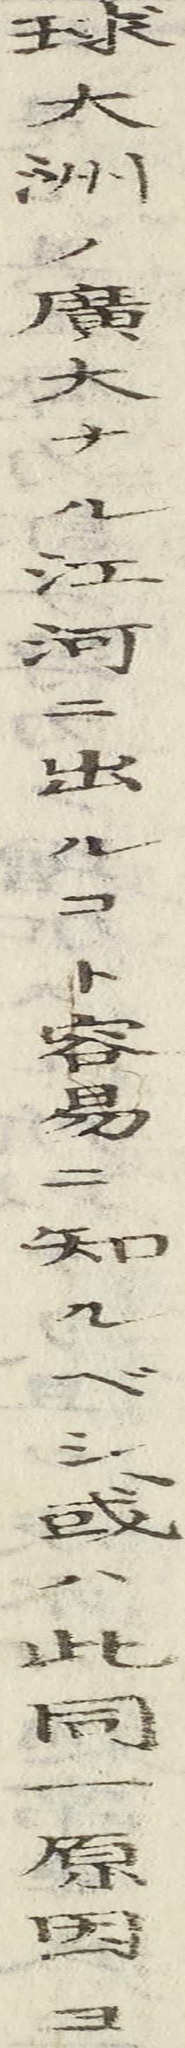球大洲ノ広大ナル江河ニ出ルコト容易ニ知ルベシ、或ハ此同一原因ヨ
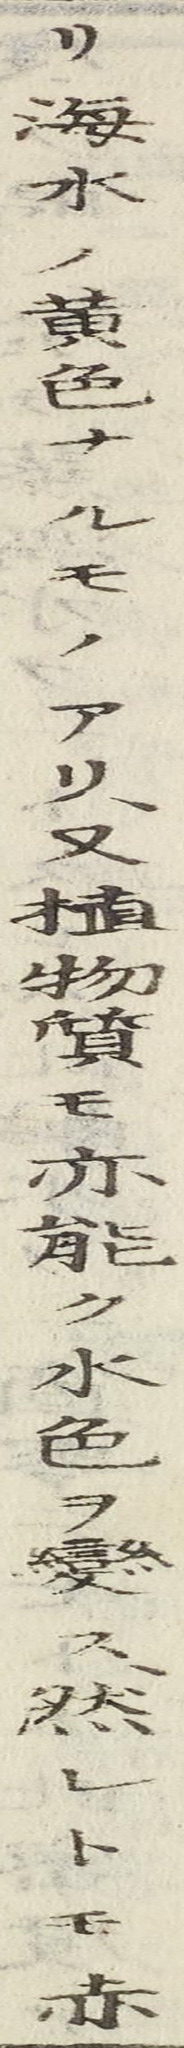リ海水ノ黄色ナルモノアリ、又植物質モ亦能ク水色ヲ変ス、然レトモ亦
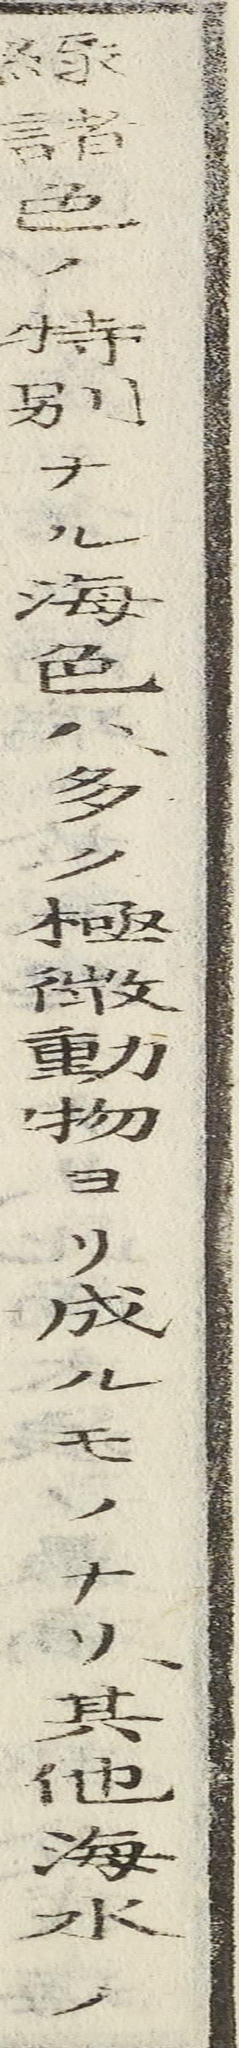緑諸色ノ特別ナル海色ハ、多ク極微動物ヨリ成ルモノナリ、其他海水ノ
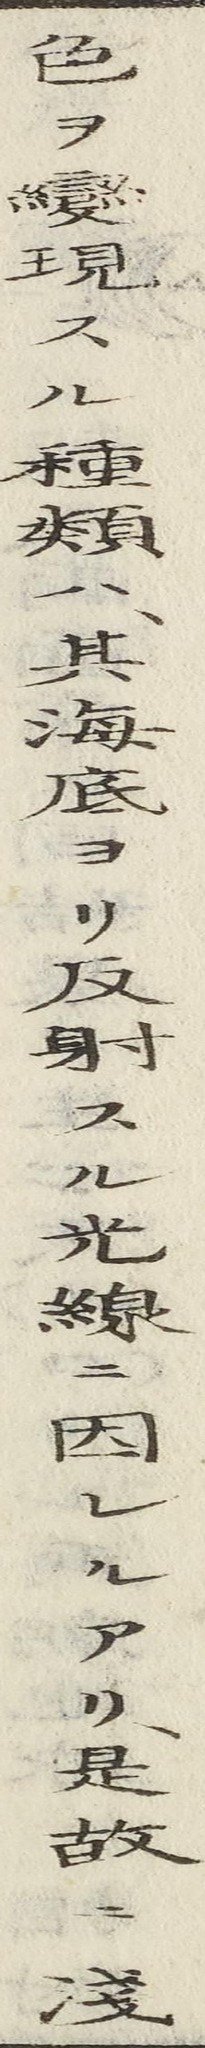色ヲ変現スル種類ハ、其海底ヨリ反射スル光線ニ因レルアリ、是故ニ浅
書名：百科全書　地文學　全
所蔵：東京大学地震研究所図書室 Earthquake Research Institute Library, The University of Tokyo, JAPAN
